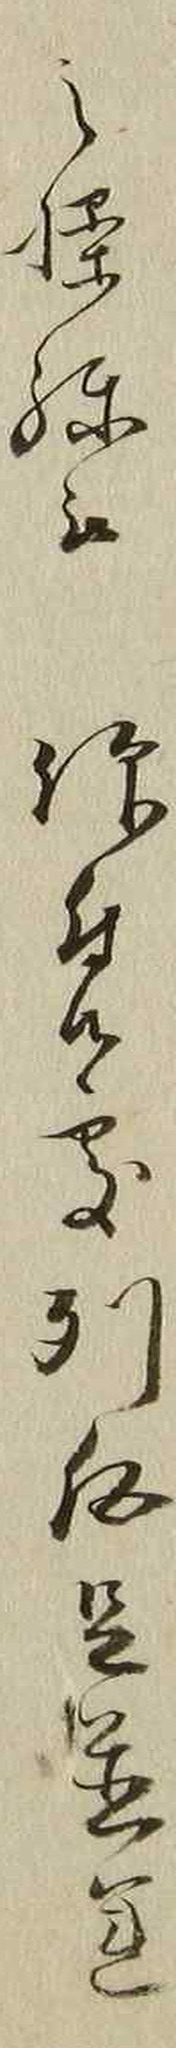之操練被仰付候処列伍足並運
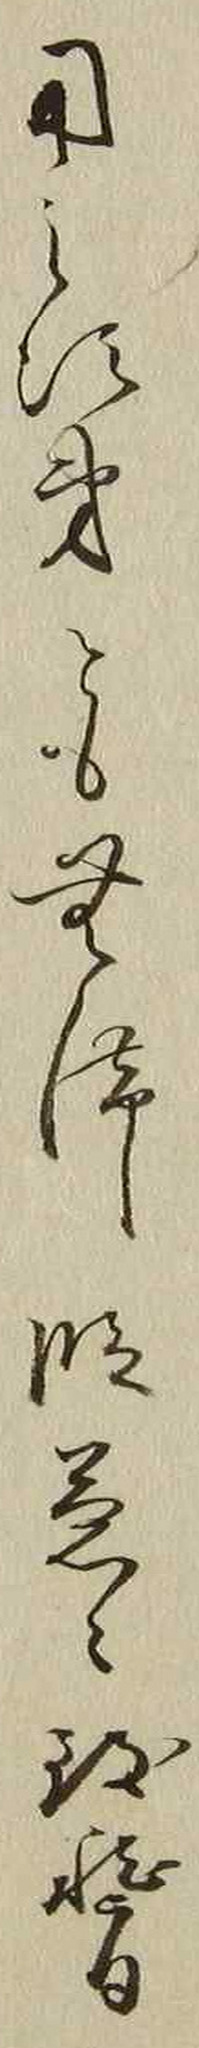用之次第とも無滞段兼々致稽
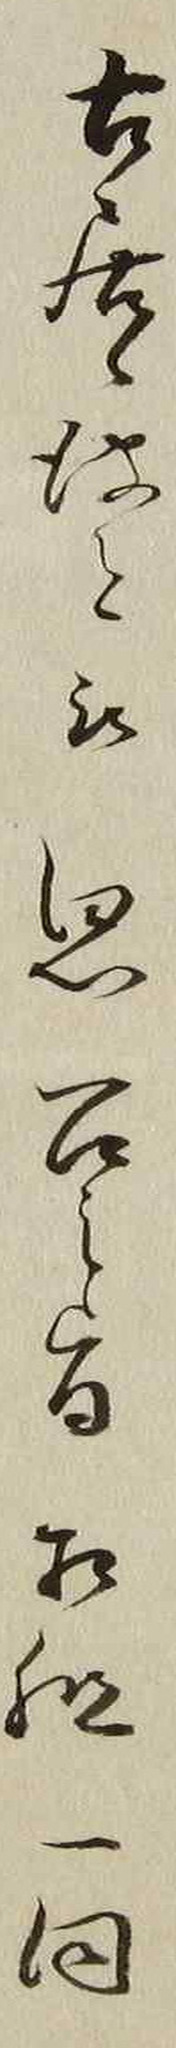古居候儀と被思召之旨相組一同
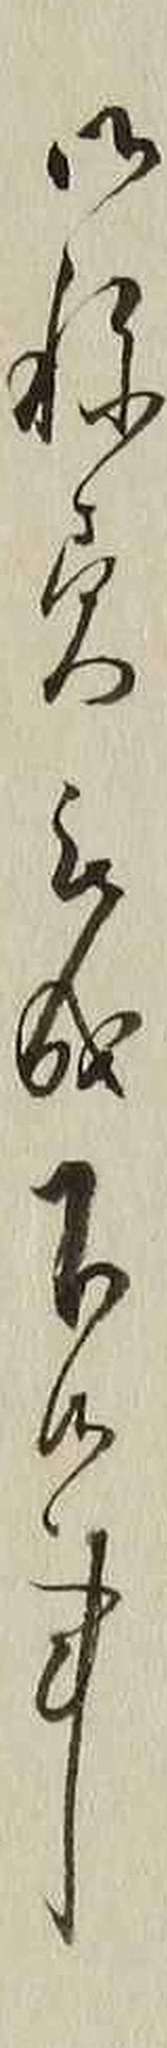御称美被成下候事
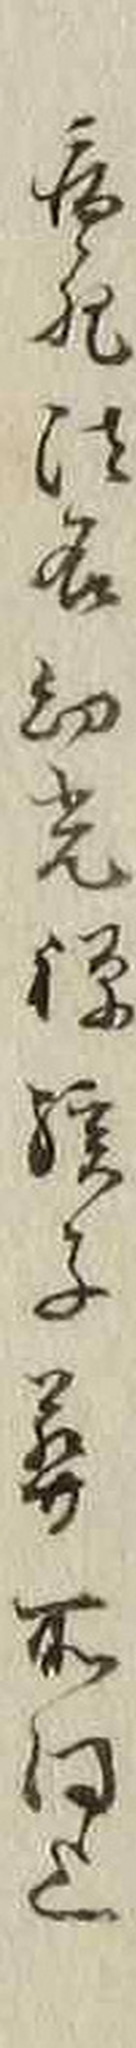病死法名初光禅孩子葬所同上
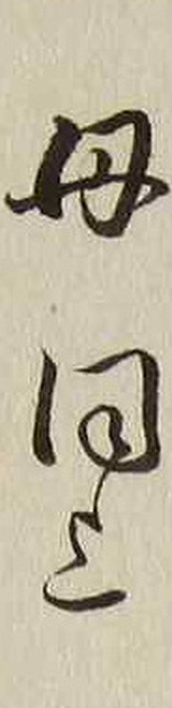母同上
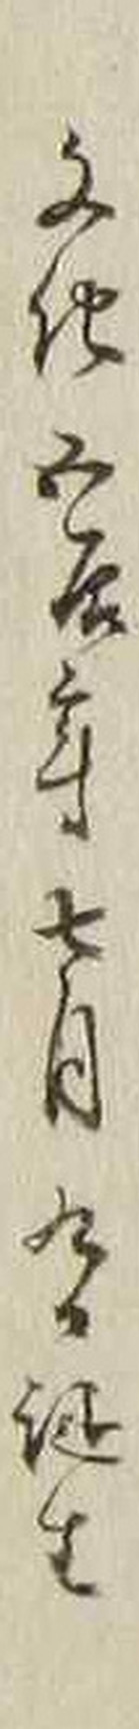文化五辰年七月九日誕生
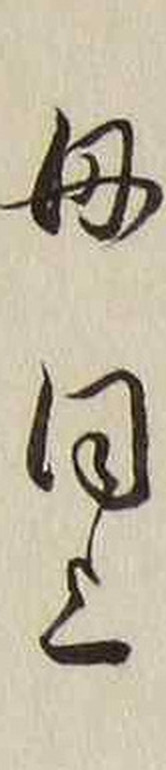母同上

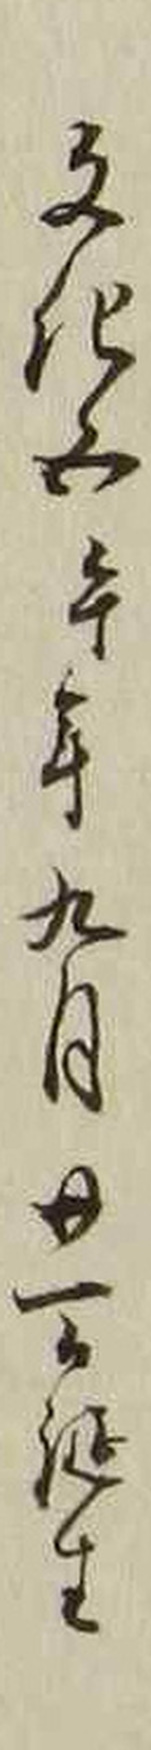文化五午年九月廿一日誕生
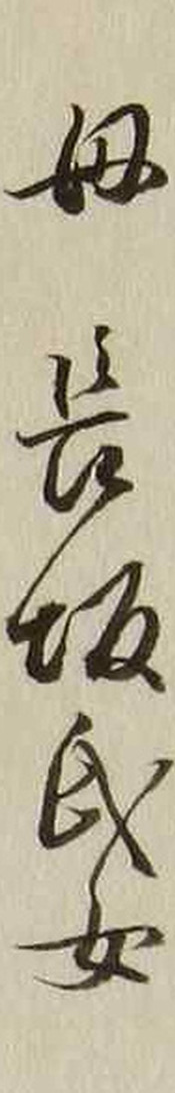母長坂氏女
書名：諸士系譜　巻之25　い之部25
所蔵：会津若松市立会津図書館
